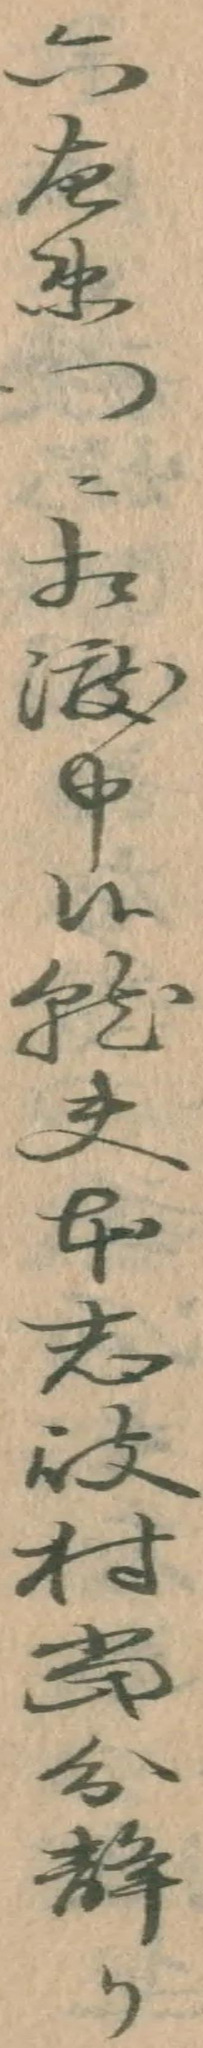六右衛門に相渡申候就夫本志岐村当分静り
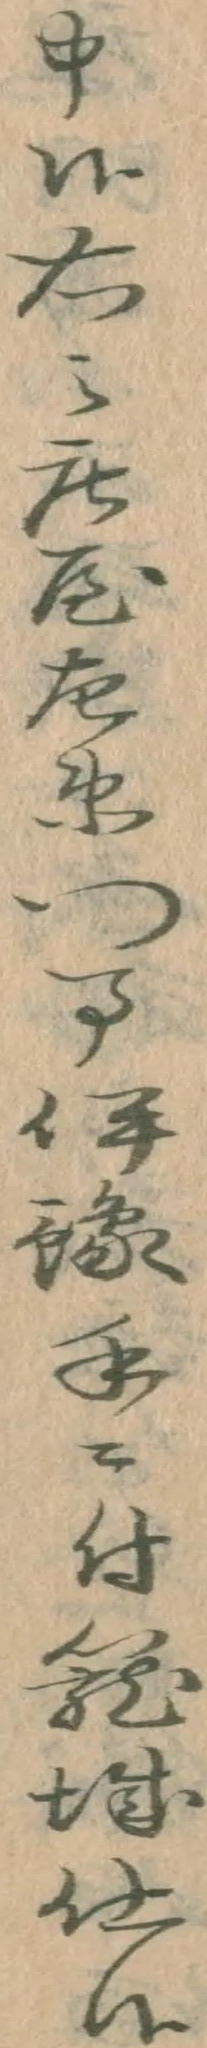申候右之庄屋左衛門事伊予手に付籠城仕候
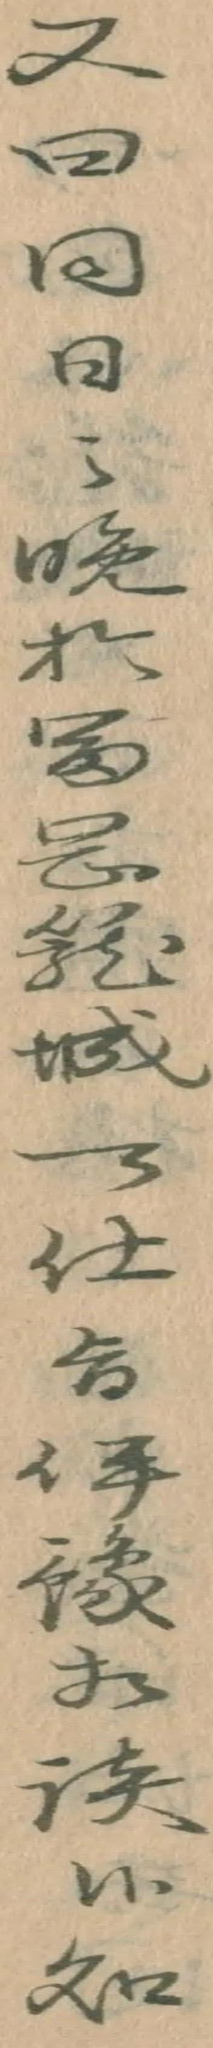又曰同日之晩於冨岡籠城可仕旨伊予相談候処
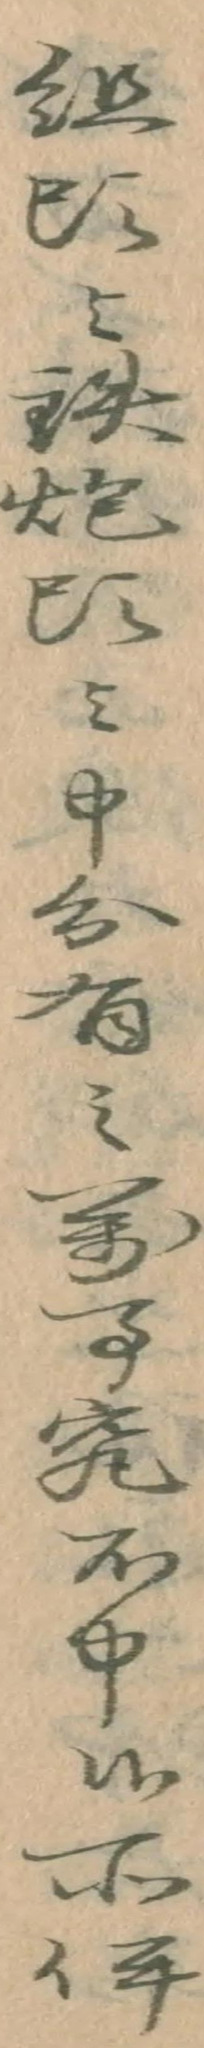組頭与鉄炮頭与申分有之万事究不申候所伊

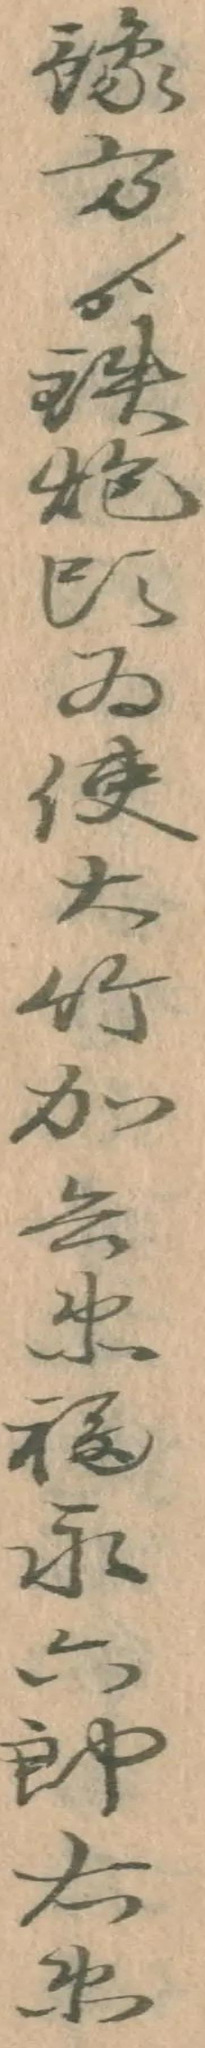予方ゟ鉄炮頭ゐ使大竹加兵衛福永六郎右衛
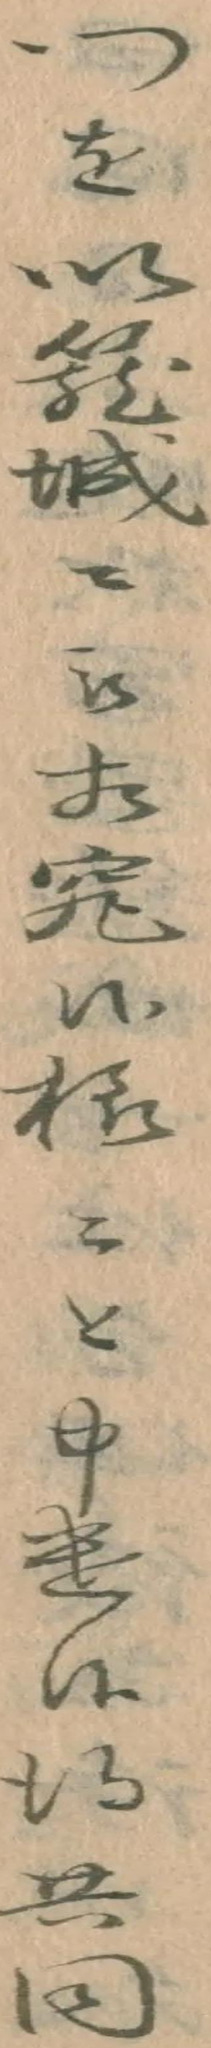門を以籠城に被相究候様にと申遣候得共同
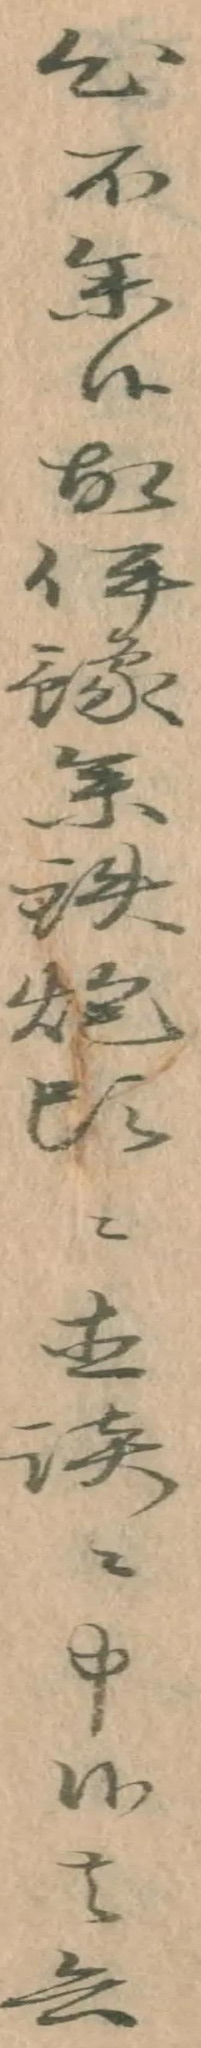心不参候故伊予参鉄炮頭に直談に申候者兵
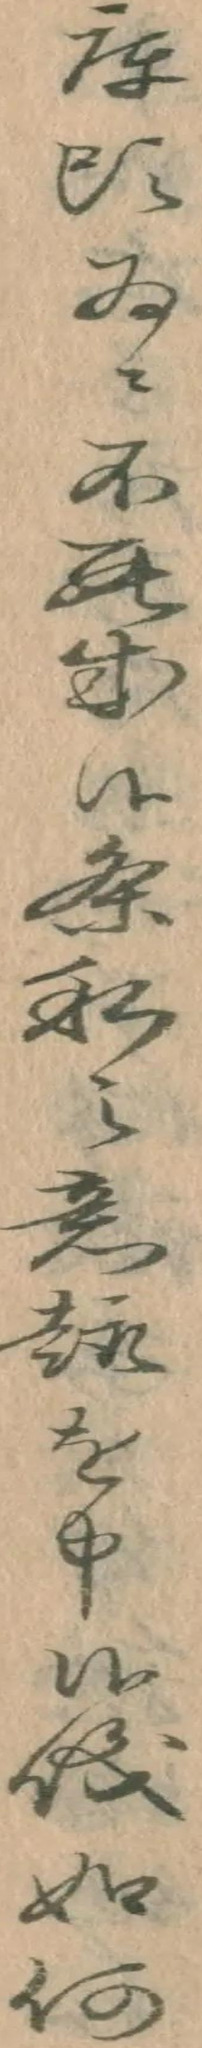庫頭ゐに不罷成候条私之意趣を申候儀如何
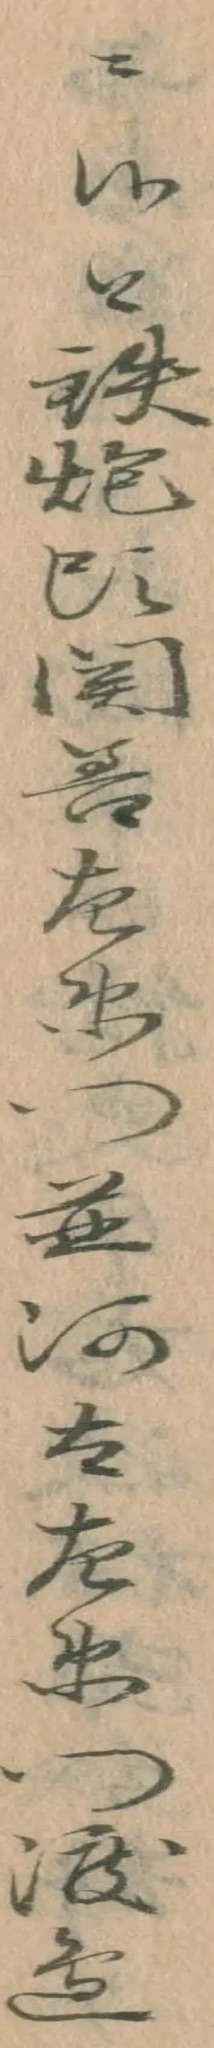に候と鉄炮頭関善左衛門並河太左衛門渡辺
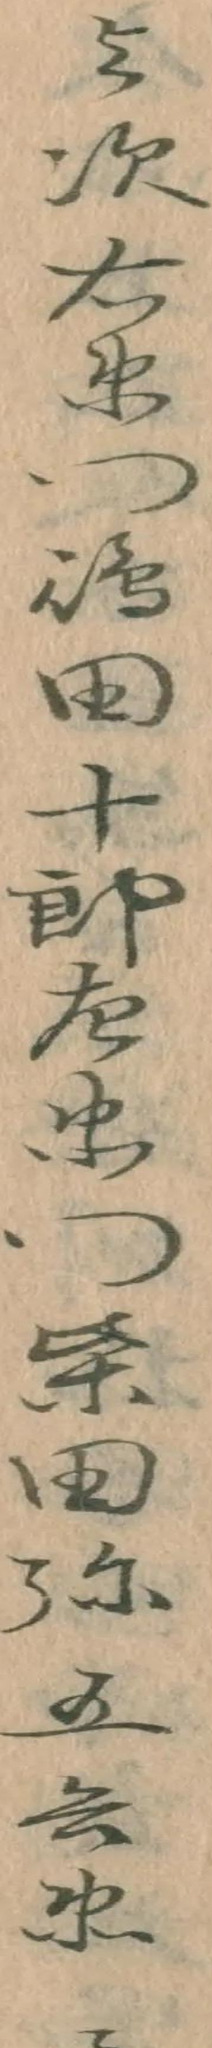与次右衛門島田十郎左衛門柴田弥五兵衛に
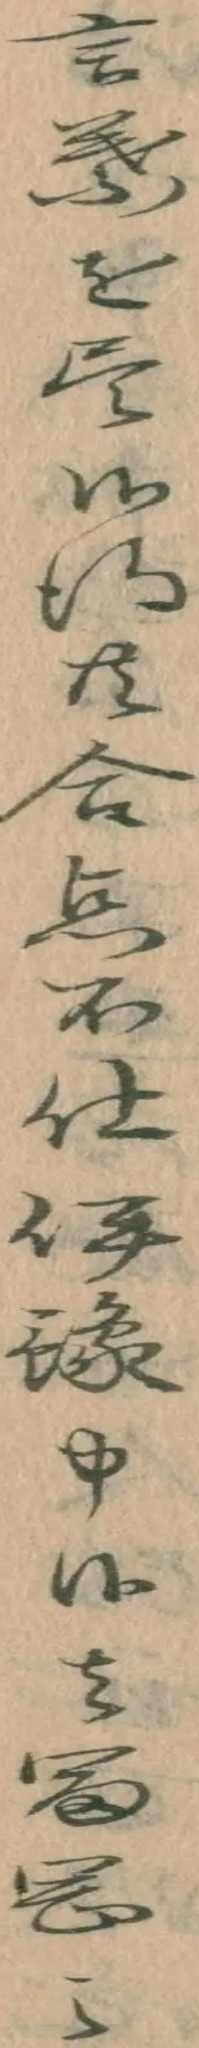言葉を尽候得共合点不仕伊予申候者冨岡之
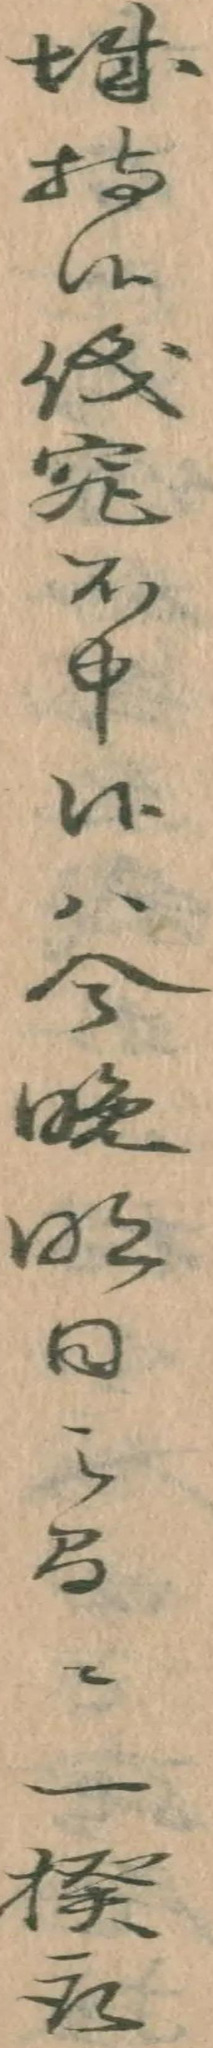城持候儀究不申候は今晩明日之間に一揆取
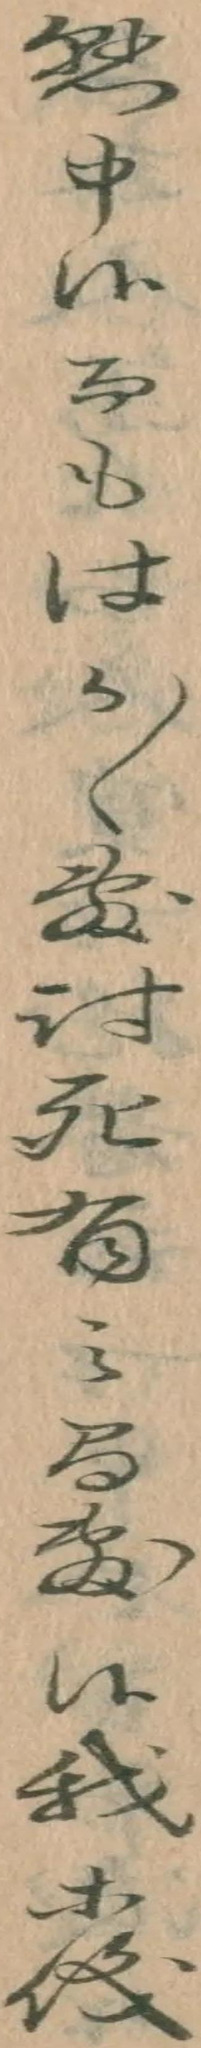懸申候而もはか〱敷討死有之間敷候我等儀
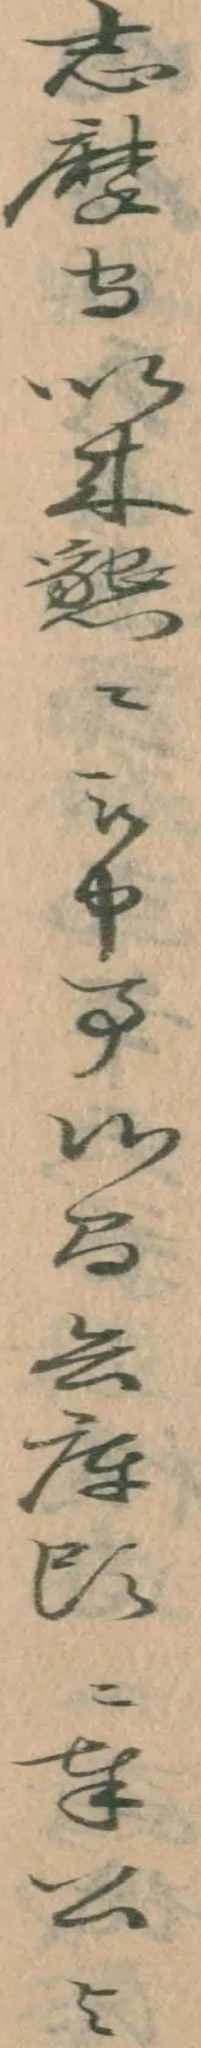志摩守以来懇に被申事候間兵庫頭に奉公与
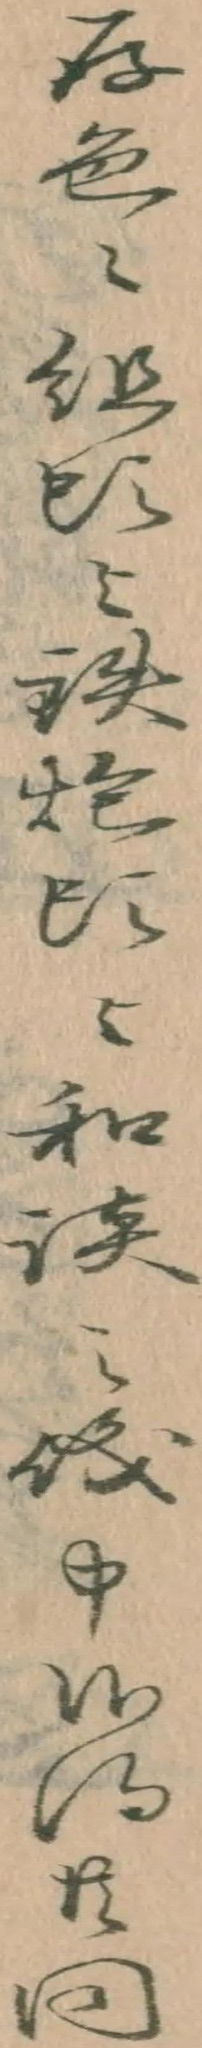存色々組頭与鉄炮頭与和談之儀申候得共同
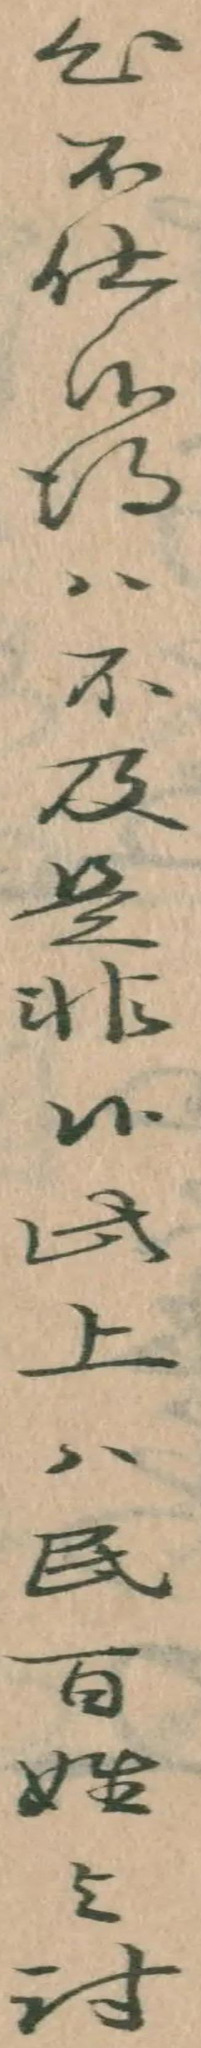心不仕候得は不及是非候此上は民百姓与討
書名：切支丹御退治記 49巻. [2]
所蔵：国立国会図書館 National Diet Library, JAPAN
